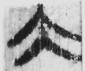大
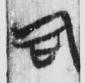司
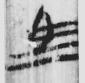馬
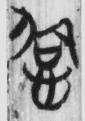○（悼）
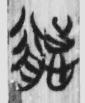○（滑）
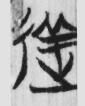𨒫（將）
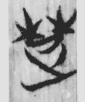楚
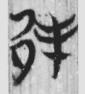邦
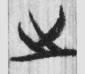之
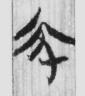帀（師）
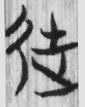徒
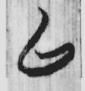㠯（以）
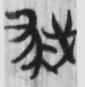○（救）
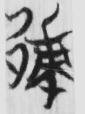郙
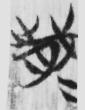歲
